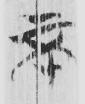不
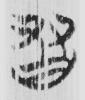{友日}
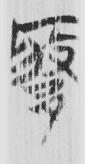{殷邑}
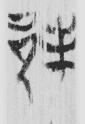邦
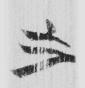之
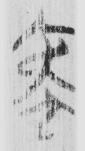{天虫}
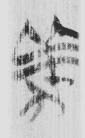{羊虫}
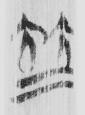並
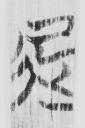起
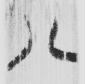八
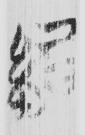{糸己口}
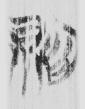則
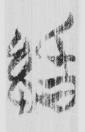{糸昏}
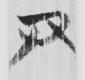四
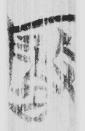{厂敢}
